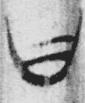曰
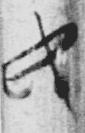女（如）
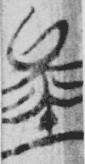○（舜）
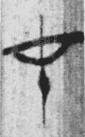才（在）
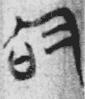含（今）
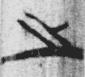之
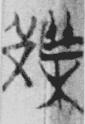○（世）
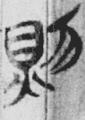則（則）
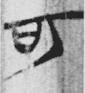可（何）
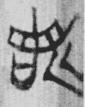若
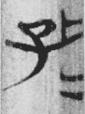孔子
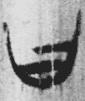曰
